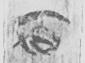百
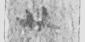廿
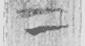二
